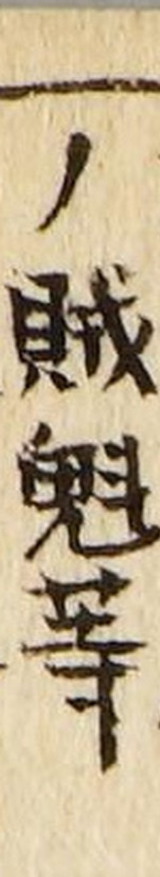ノ賊魁等
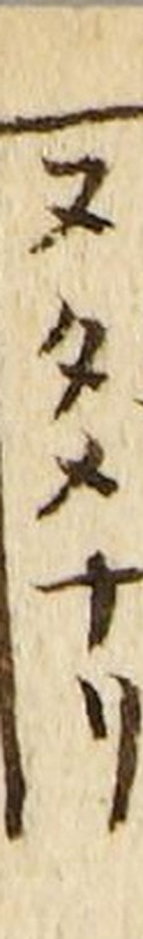ヌタメナリ
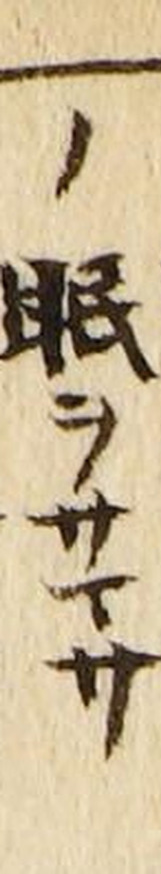ノ眠ヲサマサ
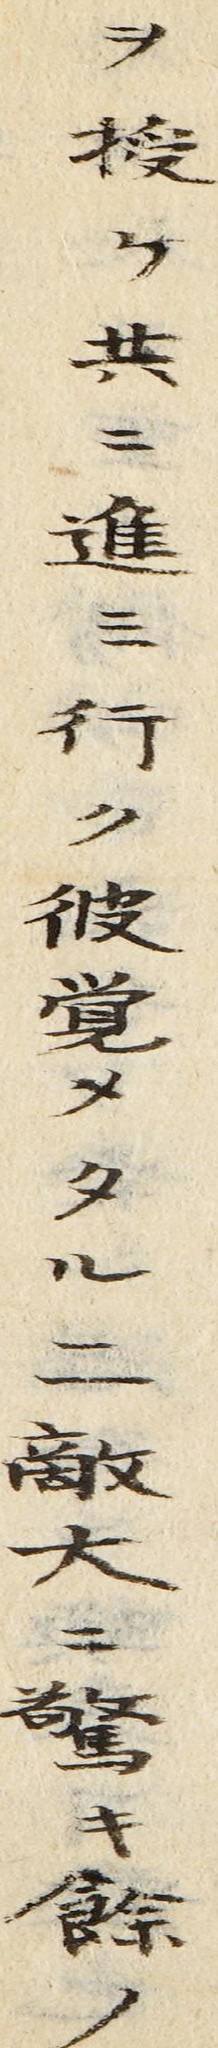ヲ授ケ共ニ進ミ行ク彼覚メタル二敵大ニ驚キ余ノ
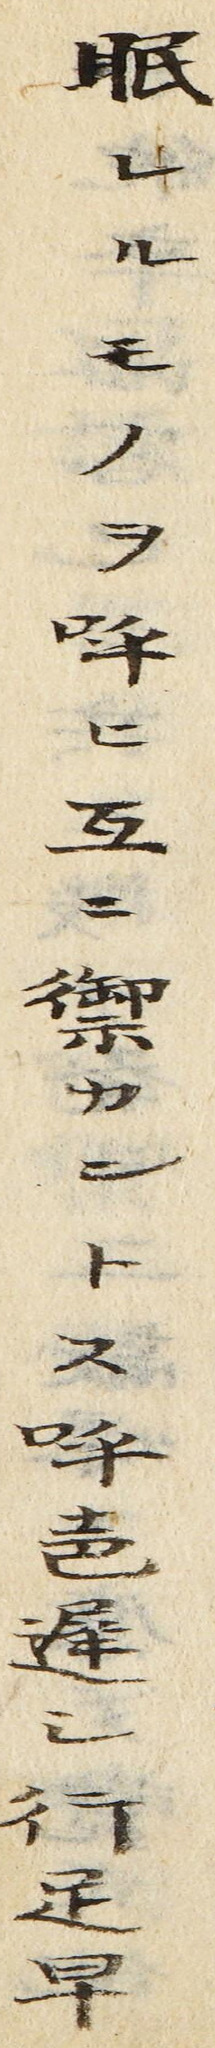眠レルモノヲ呼ヒ互ニ禦カントス呼声遅シ行足早

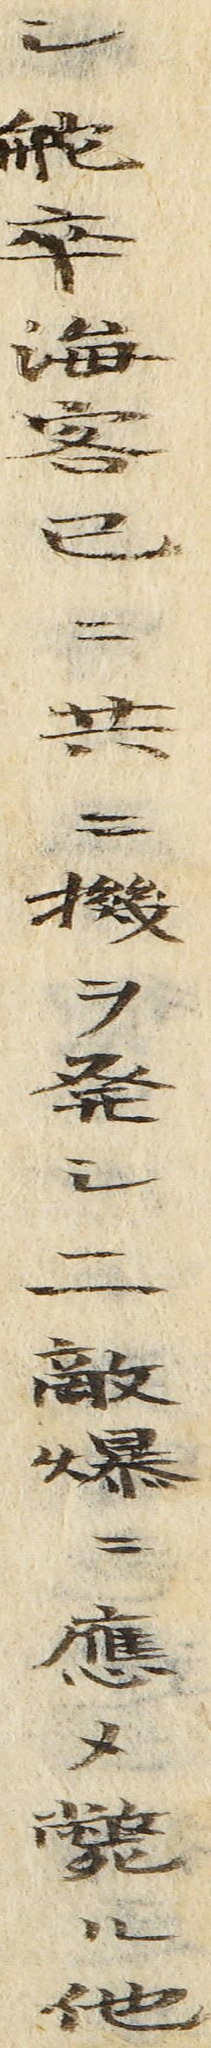シ舵卒海客已ニ共ニ機ヲ発シ二敵爆ニ応シテ斃ル他
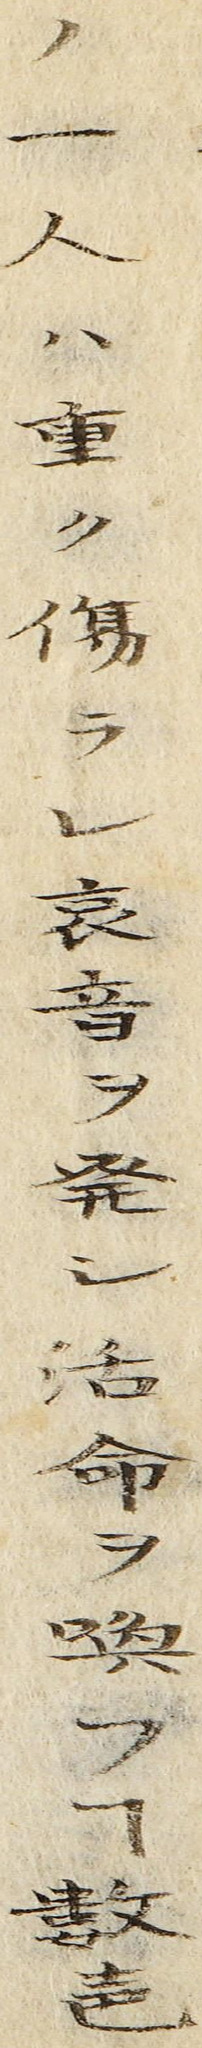ノ一人ハ重ク傷ラレ哀音ヲ発シ活命ヲ喚フコト数声
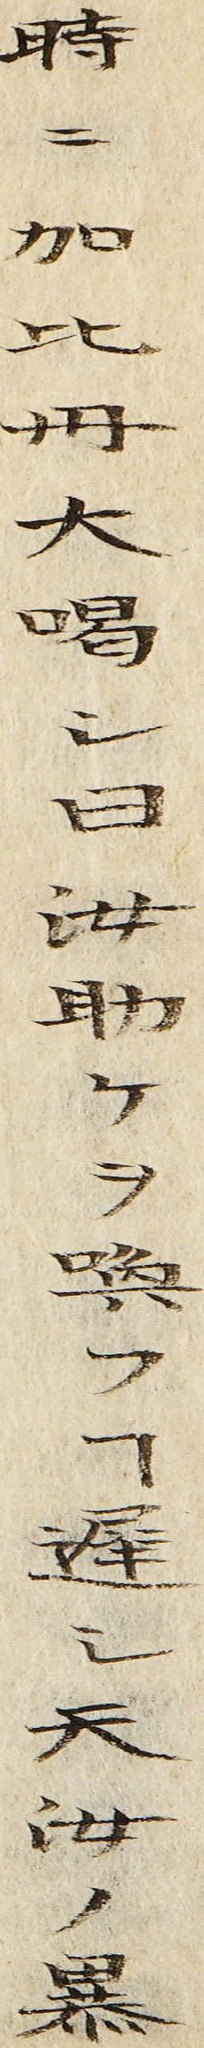時ニ加比丹大喝シ曰汝助ケヲ喚フコト遅シ天汝ノ暴
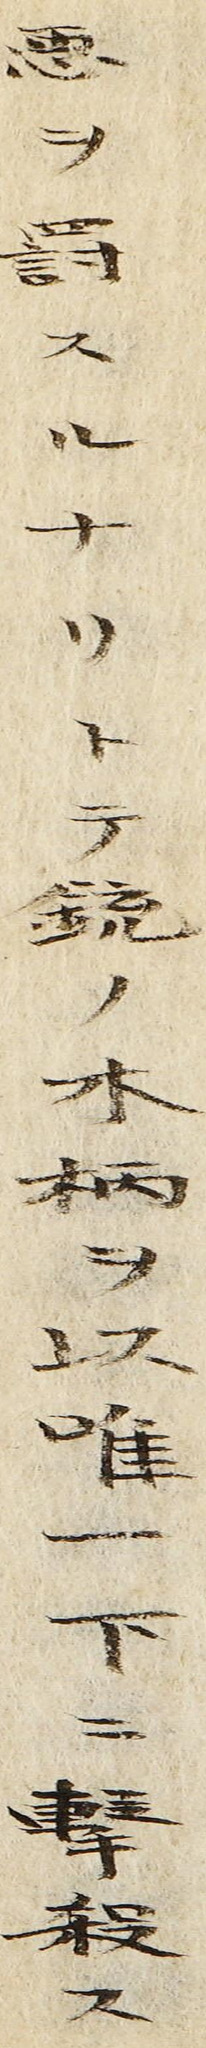悪ヲ罰スルナリトテ銃ノ木柄ヲ以唯一下ニ撃殺ス
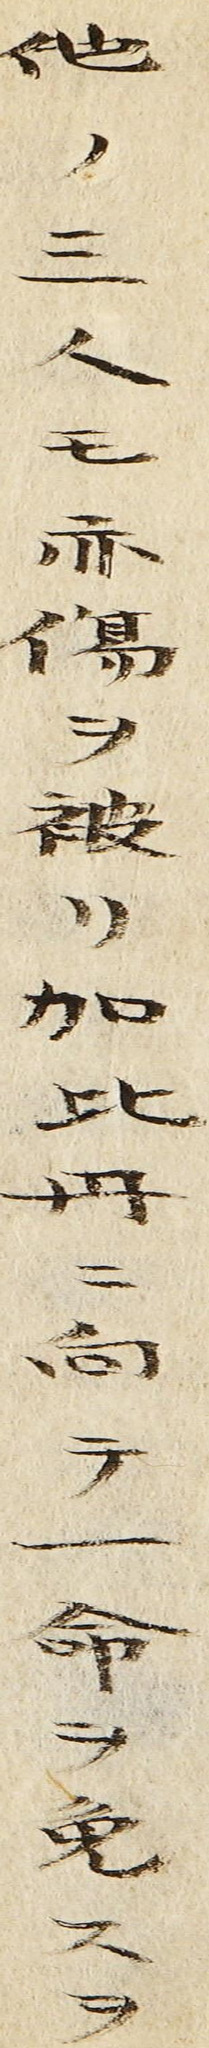他ノ三人モ亦傷ヲ被リ加比丹ニ向テ一命ヲ免スヲ
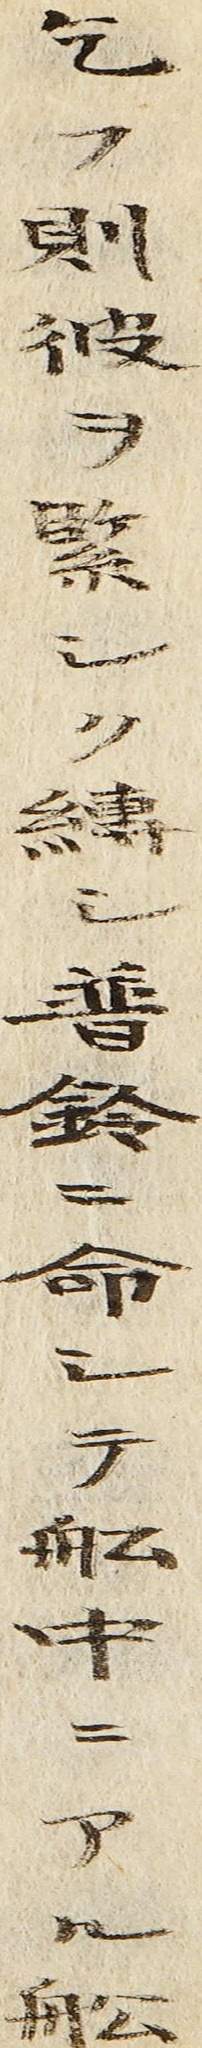乞フ則彼ヲ緊シク縛シ普鈴ニ命シテ船中ニアル船
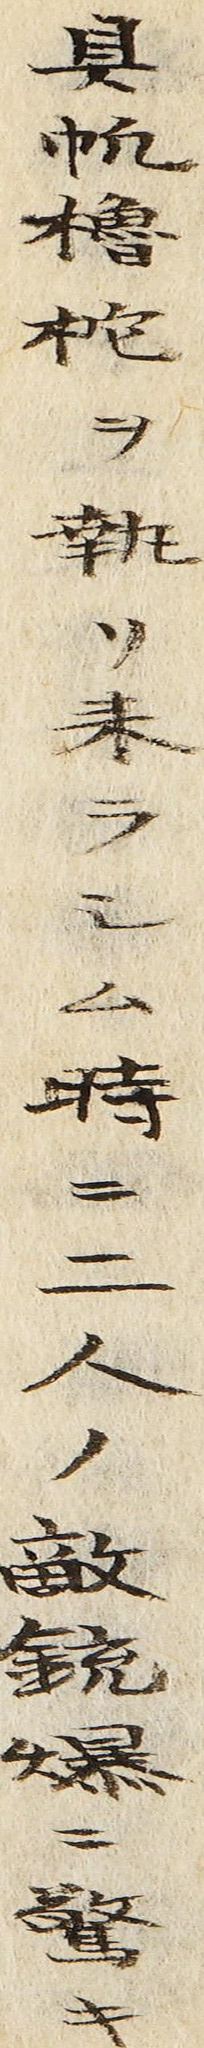具帆櫓柁ヲ執リ来ラシム時ニ二人ノ敵銃爆ニ驚キ
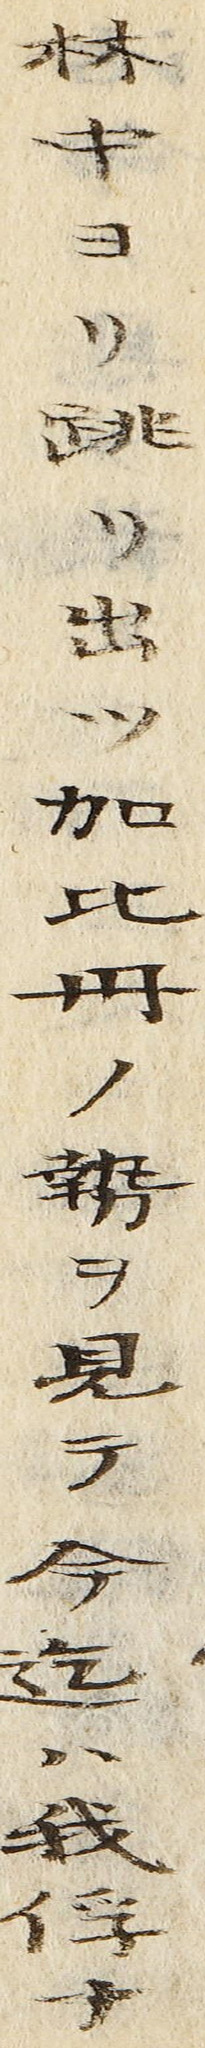林中ヨリ跳リ出ツ加比丹ノ勢ヲ見テ今迄ハ我俘ナ
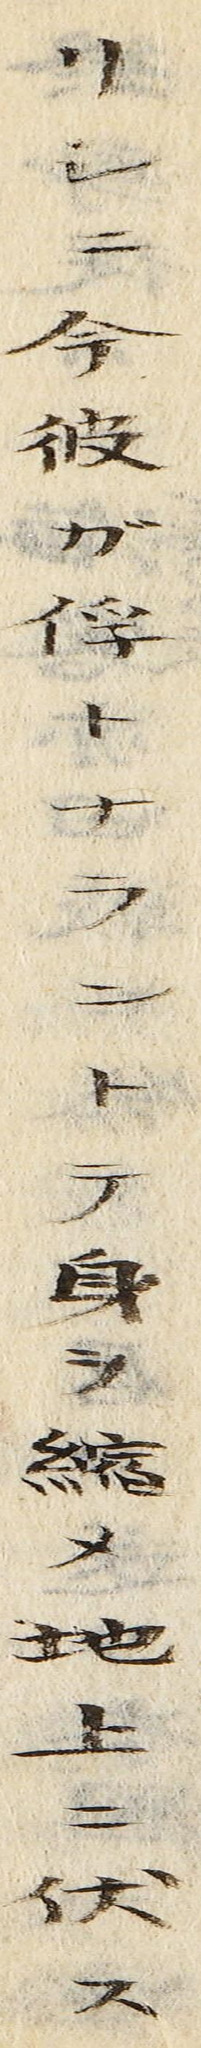リシニ今彼ガ俘トナラントテ身ヲ縮メ地上ニ伏ス
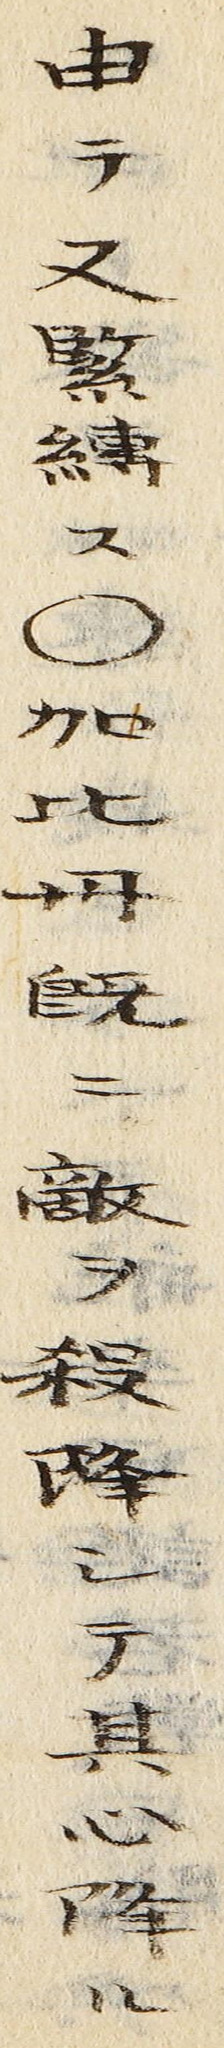由テ又緊縛ス◯加比丹既ニ敵ヲ殺降シテ其心降ル
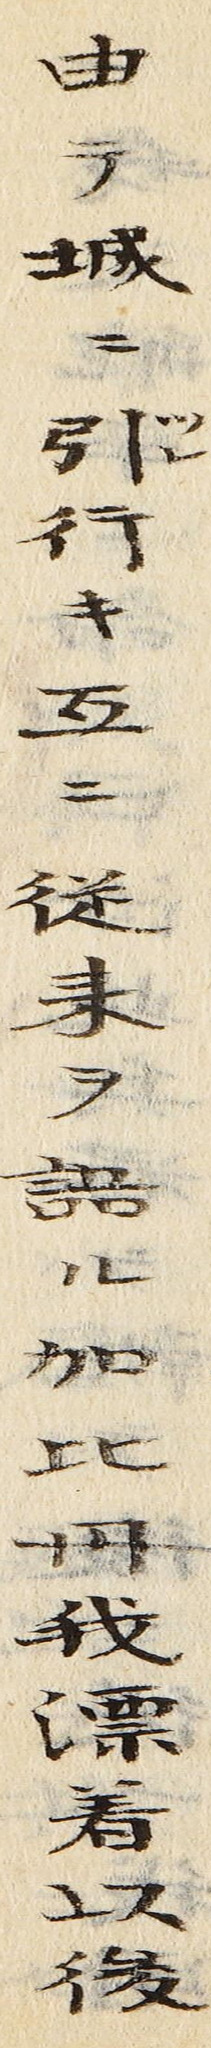由テ城ニ引行キ互ニ従来ヲ語ル加比丹我漂着以後
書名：漂流紀事
